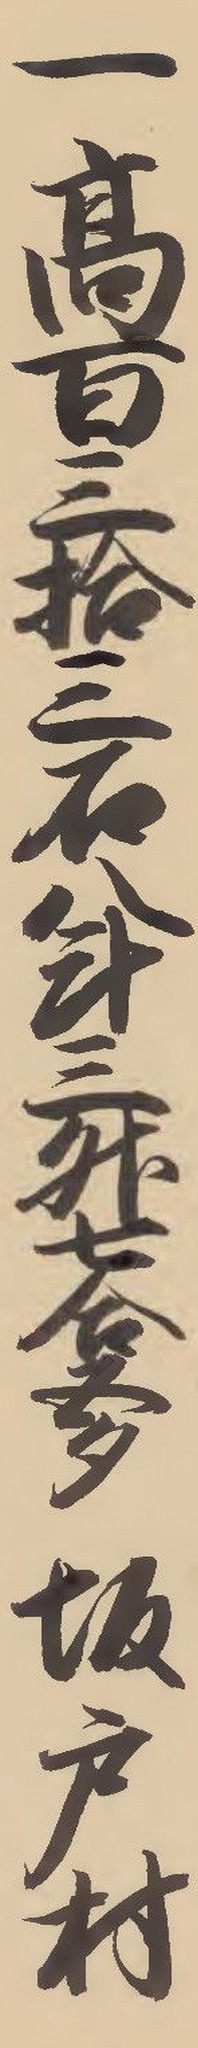一高百三拾三石八斗三升七合五勺坂戸村
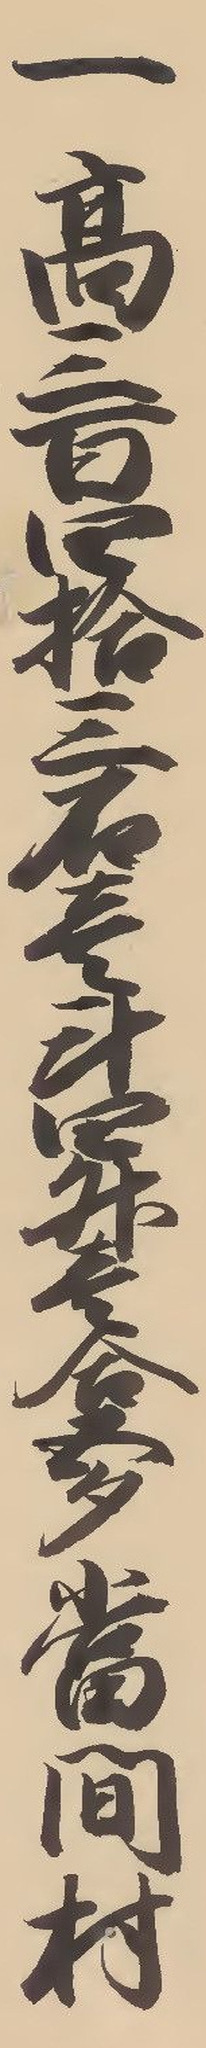一高三百四拾三石壱斗四升壱合五勺当間村
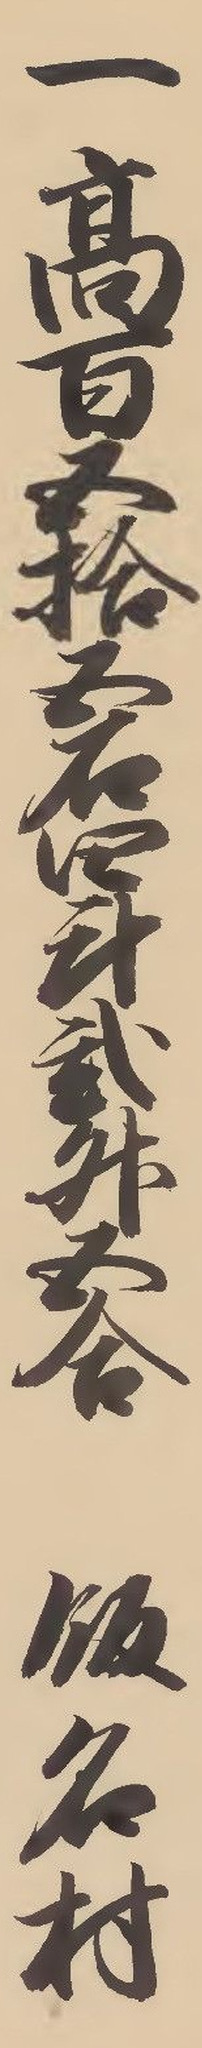一高百五拾五石四斗弐升五合飯名村
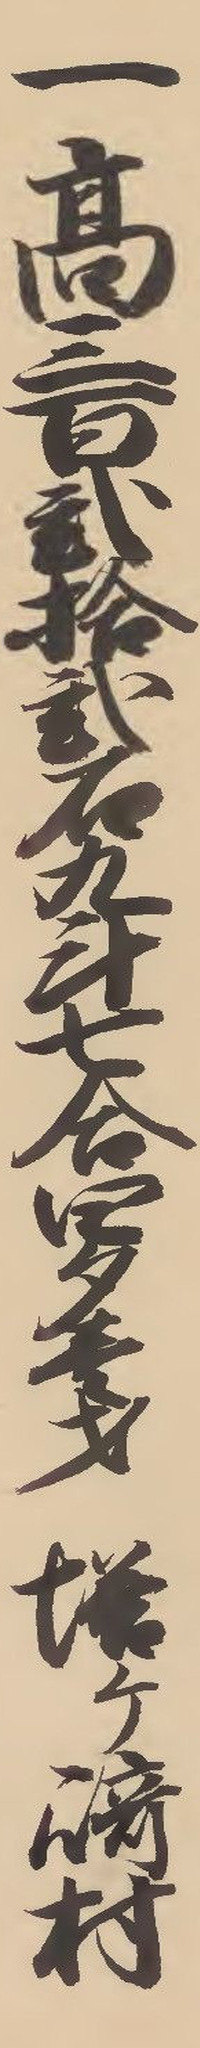一高三百弐拾弐石九斗七合四勺壱才塔ヶ崎村
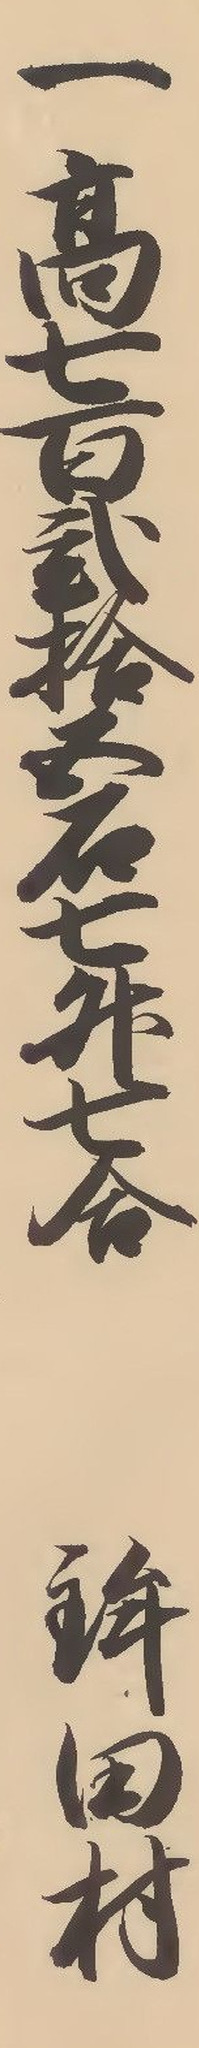一高七百弐拾五石七升七合鉾田村
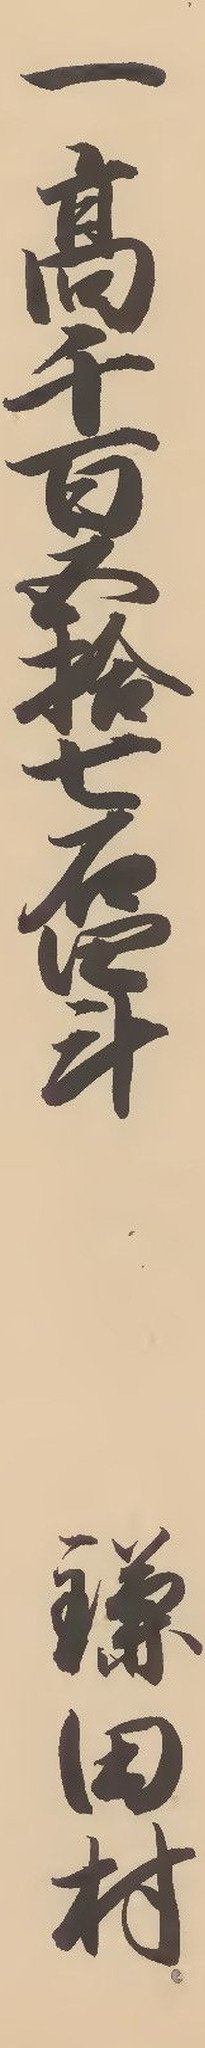一高千百五拾七石四斗鎌田村
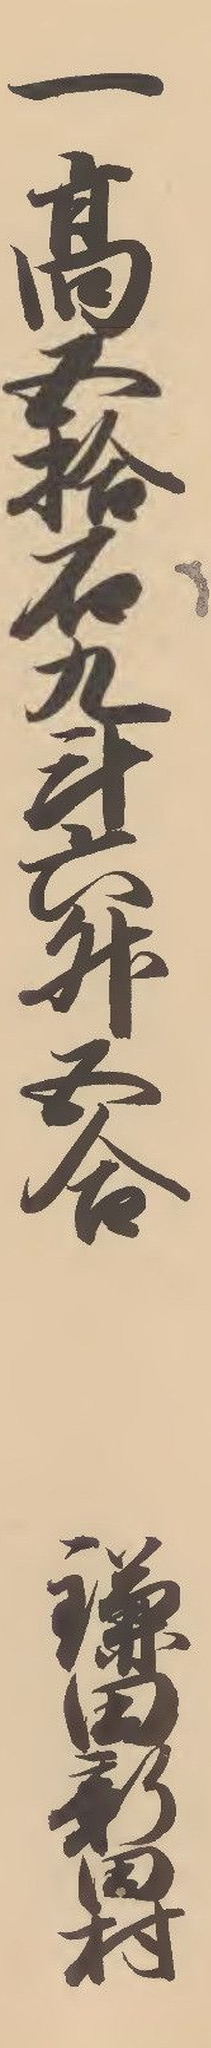一高五拾石九斗六升五合鎌田新田村
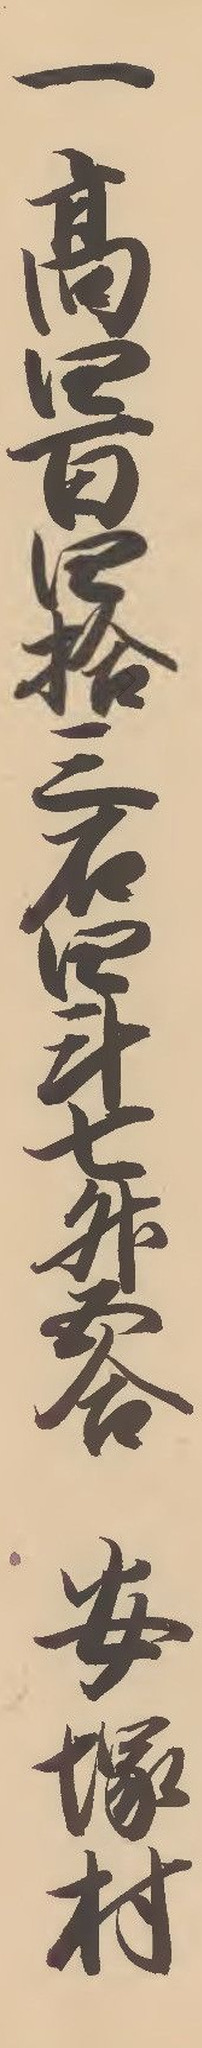一高四百四拾三石四斗七升五合安塚村

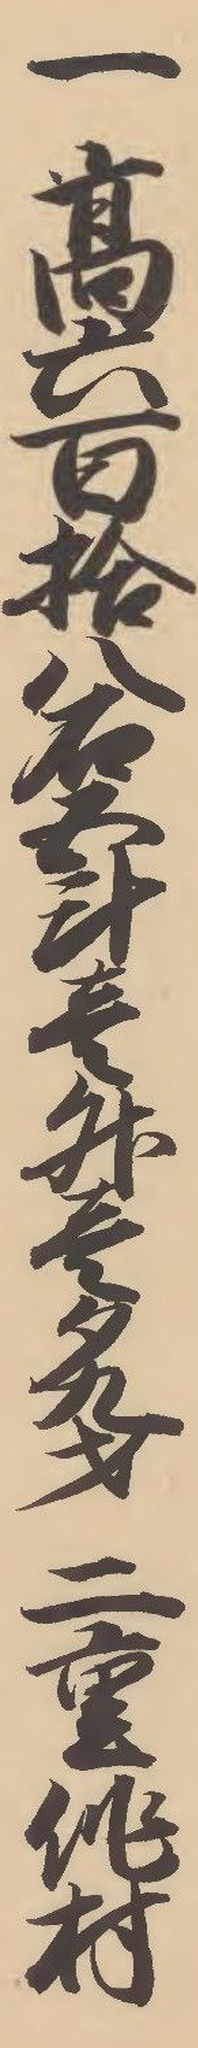一高六百拾八石五斗壱升壱勺九才二重作村
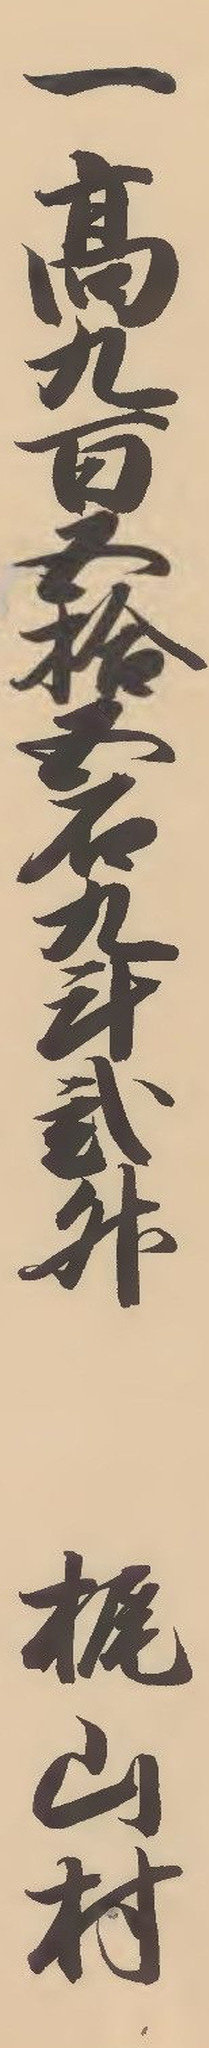一高九百五拾五石九斗弐升梶山村
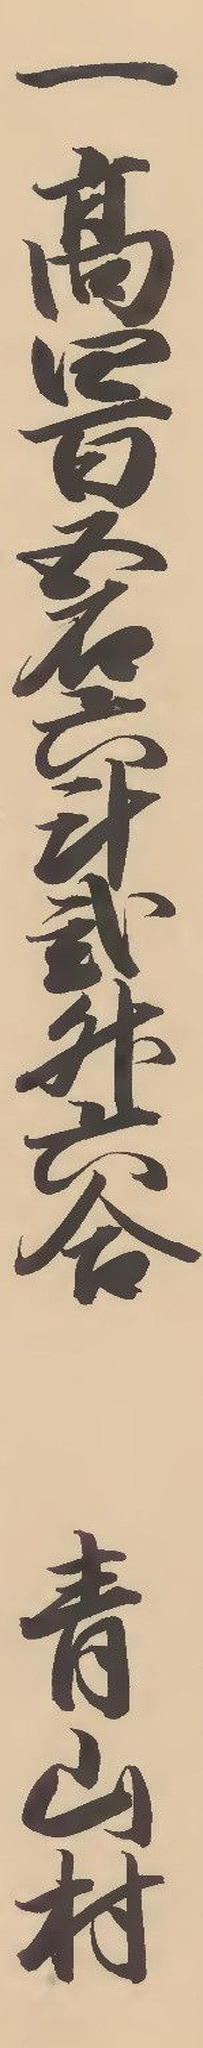一高四百五石六斗弐升六合青山村
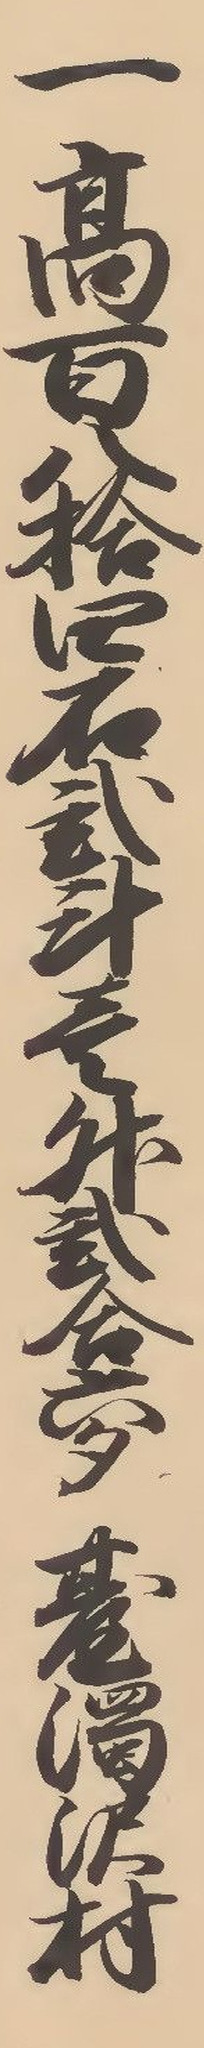一高百八拾四石弐斗壱升弐合六勺台濁沢村
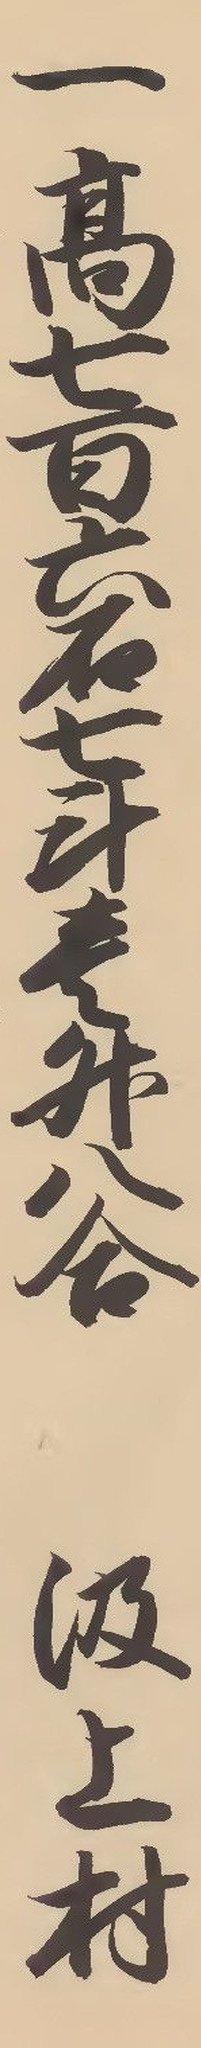一高七百六石七斗壱升八合汲上村
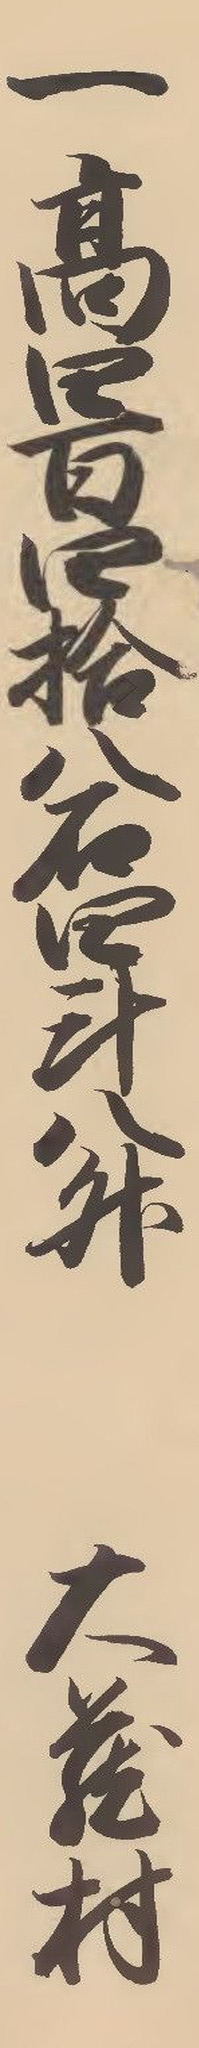一高四百四拾八石四斗八升大蔵村
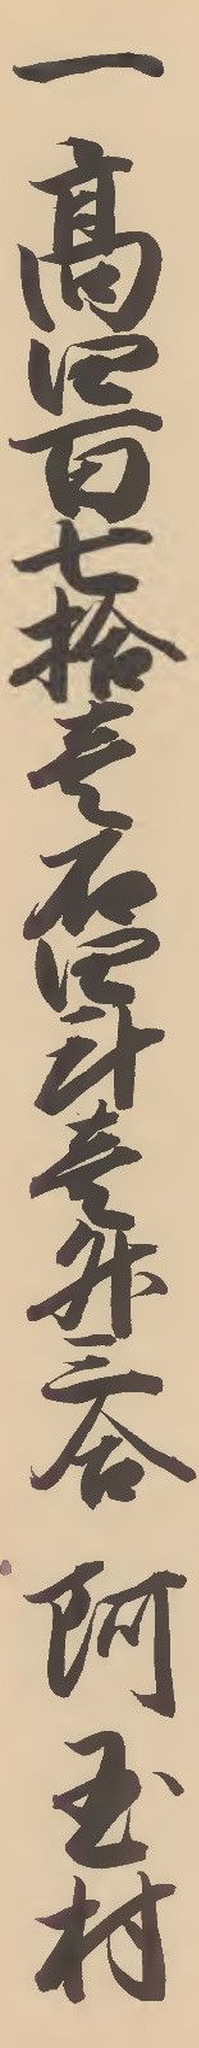一高四百七拾壱石四斗壱升三合阿玉村

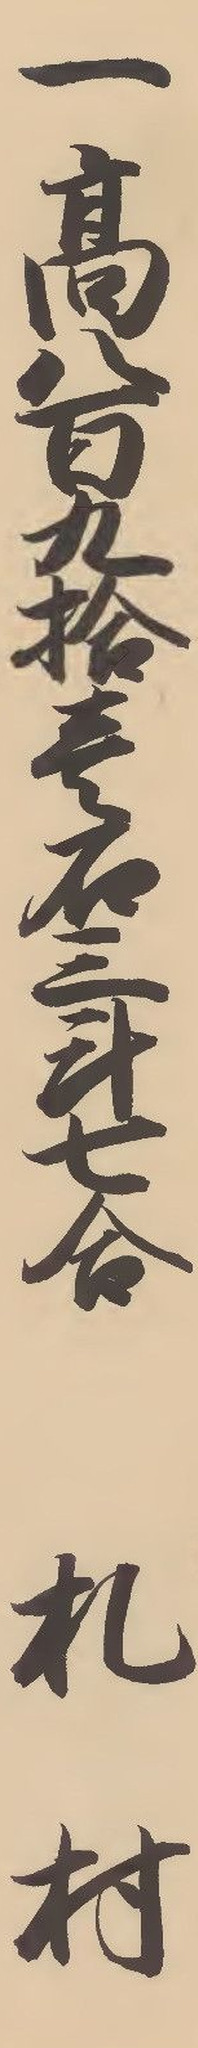一高八百九拾壱石三斗七合札村
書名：常陸国郷帳
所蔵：国立公文書館 National Archives of Japan
